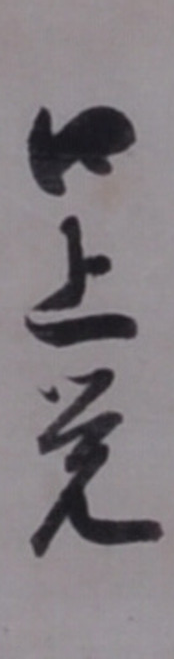口上覚
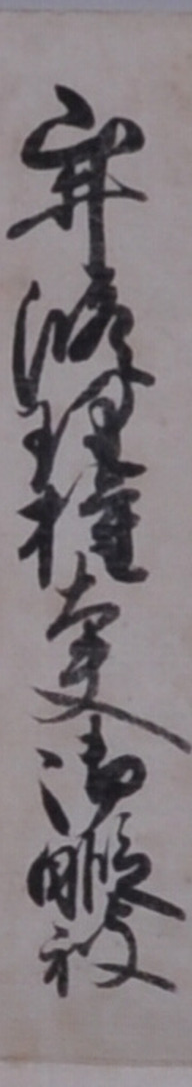山井修理権大夫御暇被
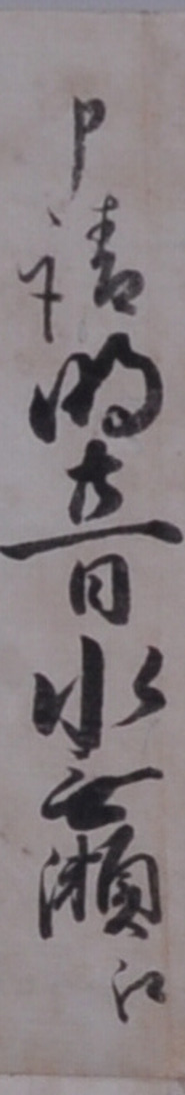申請明廿一日水無瀬え
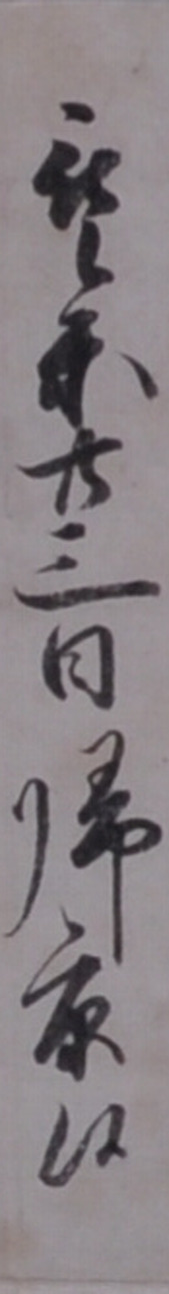被参廿三日帰京候
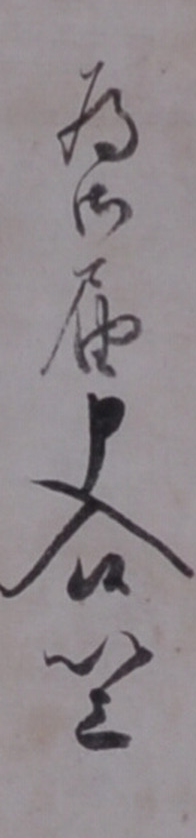為御届申入候以上
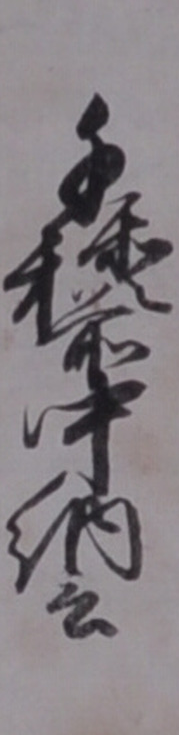千種前中納言
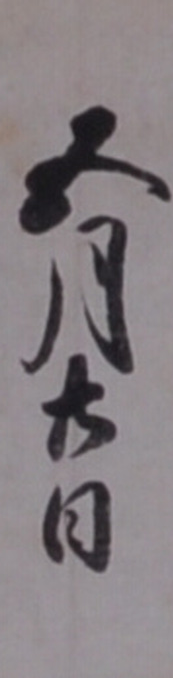五月廿日
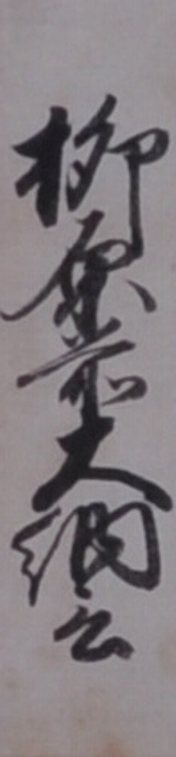柳原前大納言
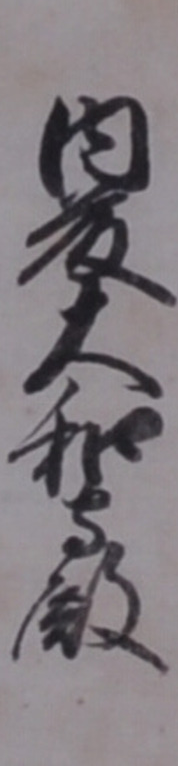内藤大和守殿
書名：口上覚
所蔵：伊那市立高遠町図書館・合同会社AMANE
